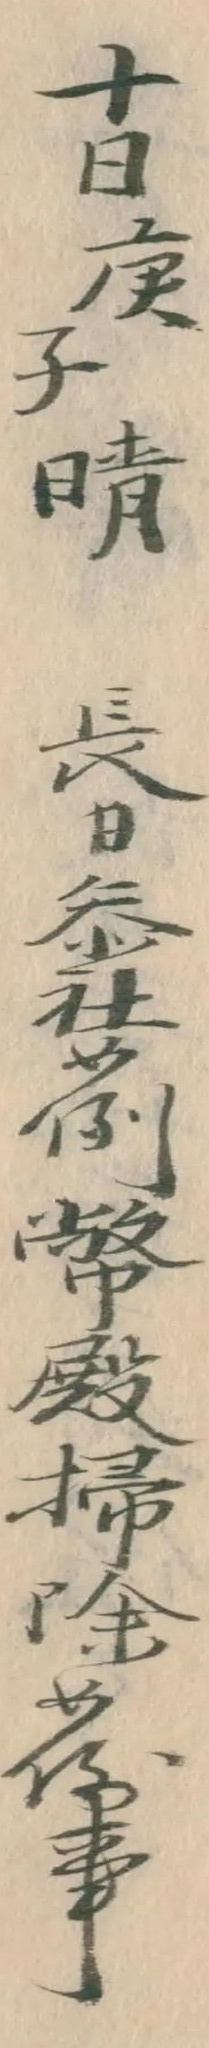十日庚子晴長日参社如例幣殿掃除如例事
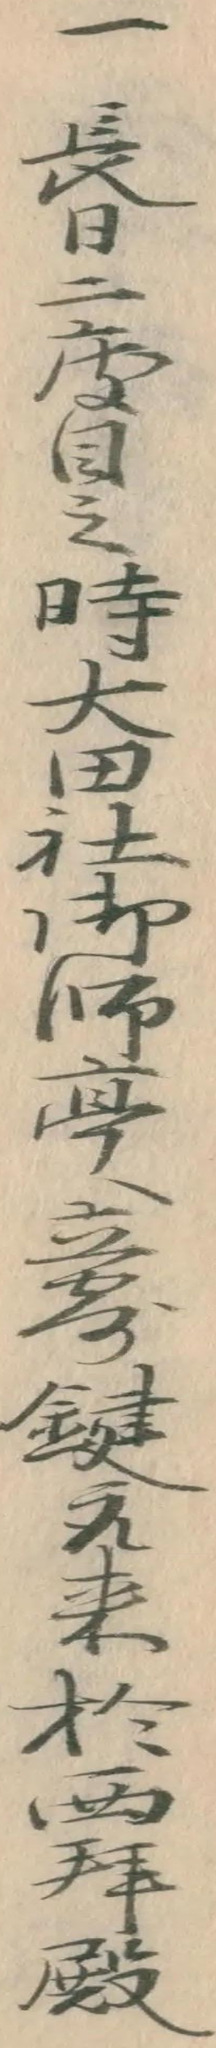一長日二度目之時大田社御師亭へ立寄取来於西拝殿

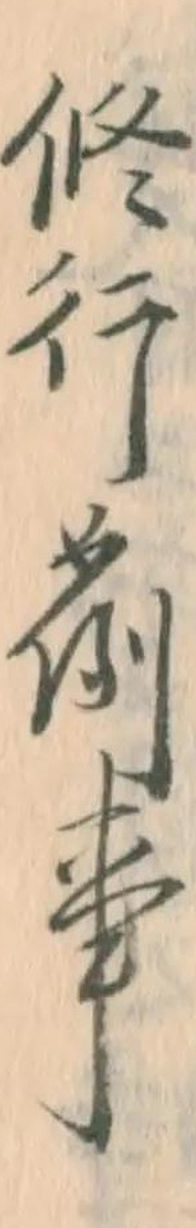修行如例事
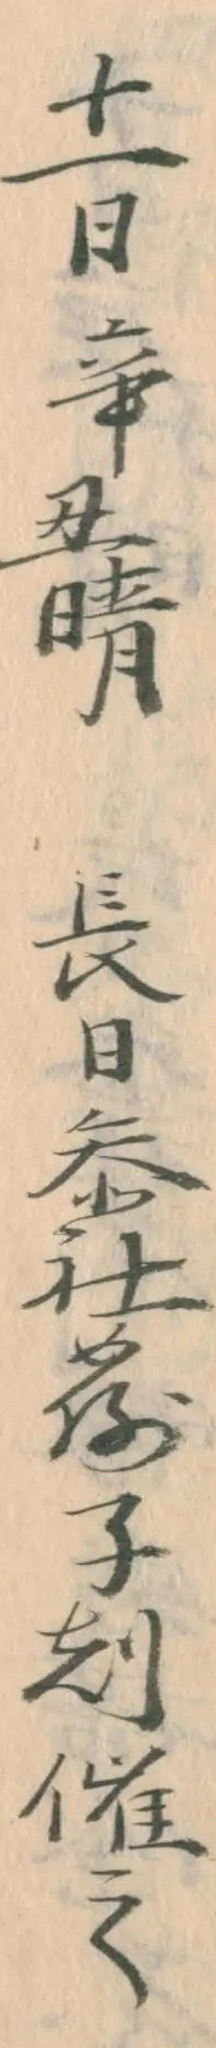十一日辛丑晴長日参社如例子刻催之
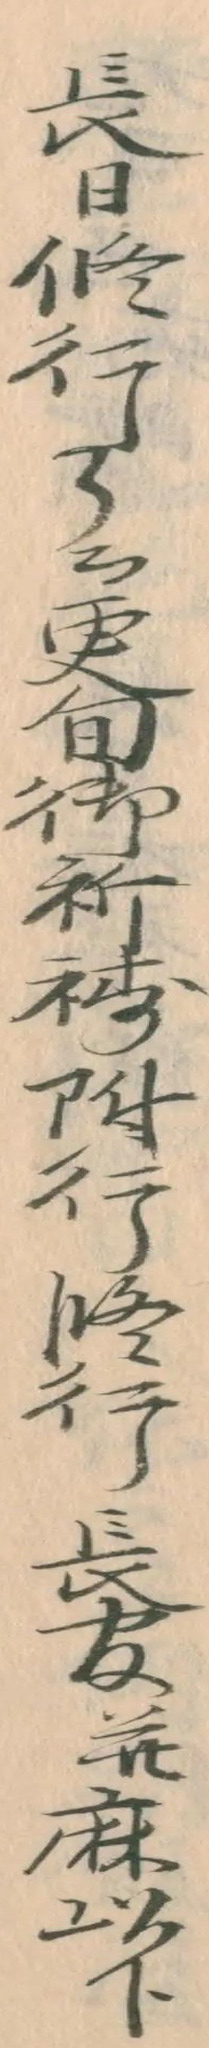一長日修行了而更旬御祈祷附行修行長官并麻以下
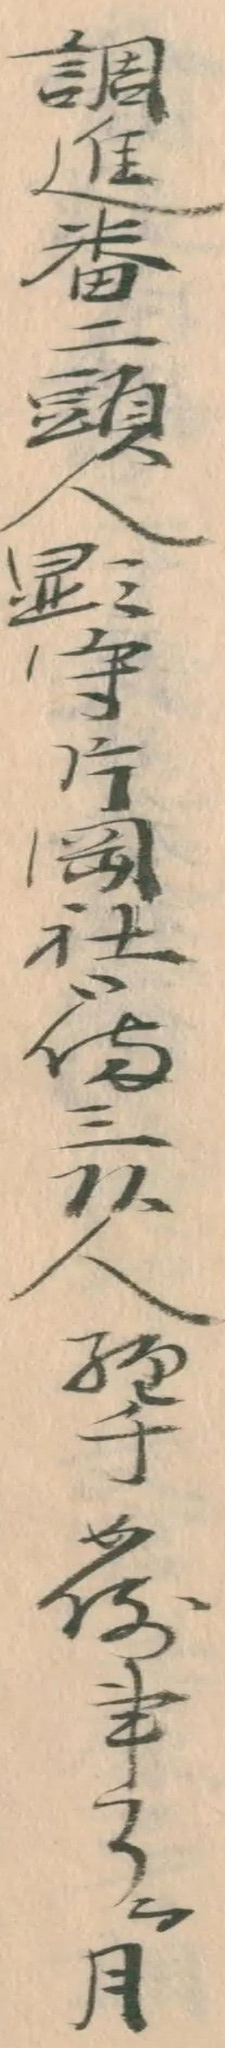調進番二頭人顕守片岡社御備三頭人経千如例事了而月
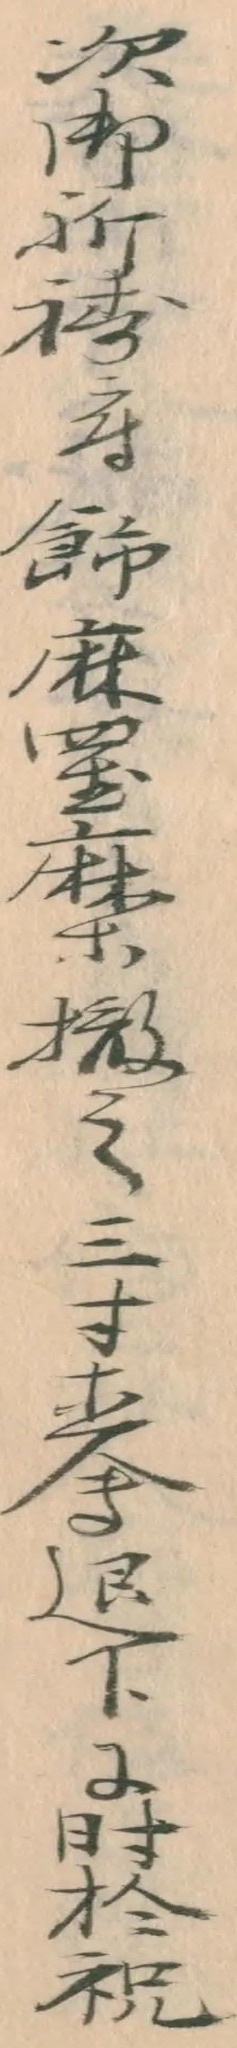次御祈祷ニ付飾麻置麻等撒之三寸直會退下于時於祝
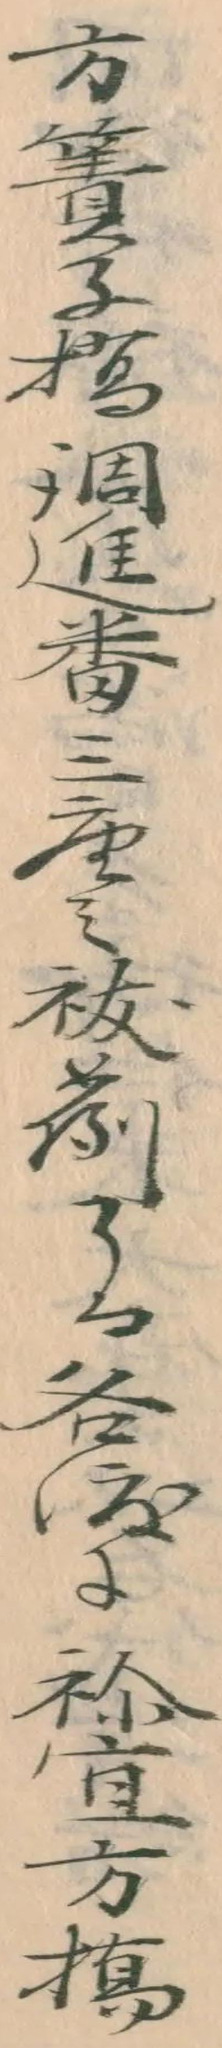方簀子橋調進番三座之祓如例了而各渡于祢宜方橋
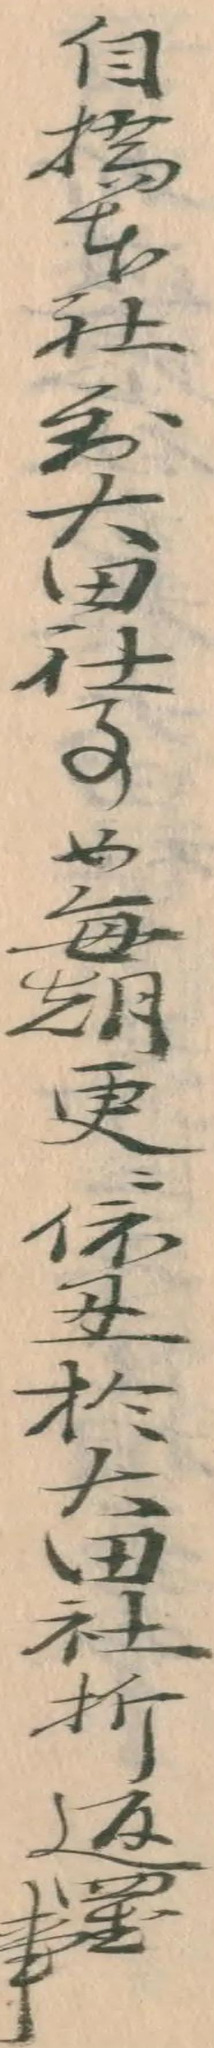自橋本社到大田社事如毎朝更ニ依丑於大田社折返置事
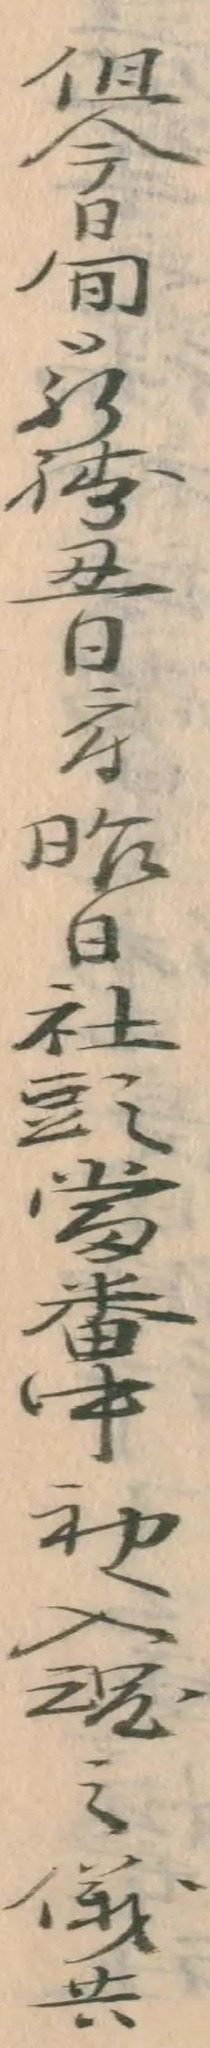但今日旬御祈祷丑日ニ付昨日社頭當番中初へ入魂之儀共
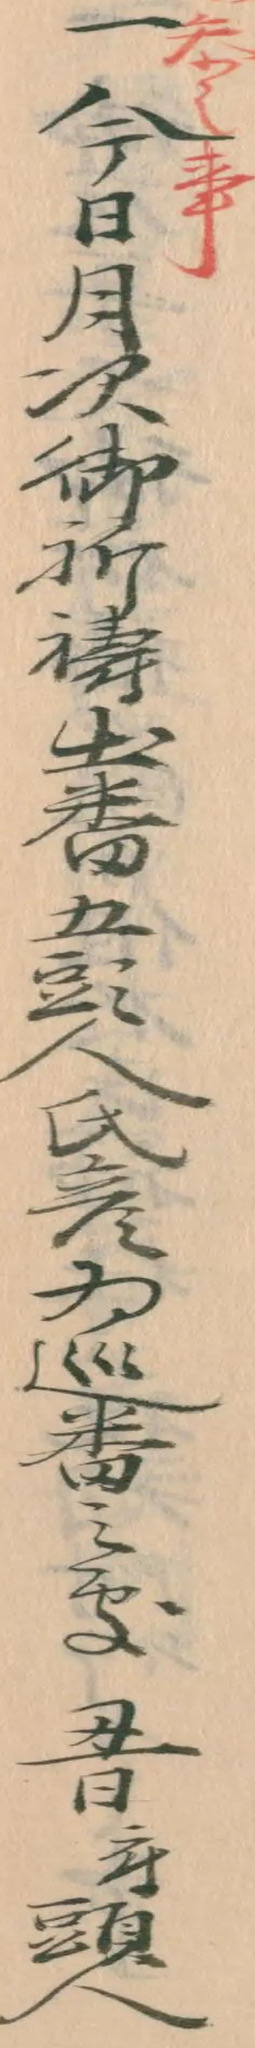一今日月次御祈祷出番五頭人氏彦為巡番之處丑日ニ付頭人
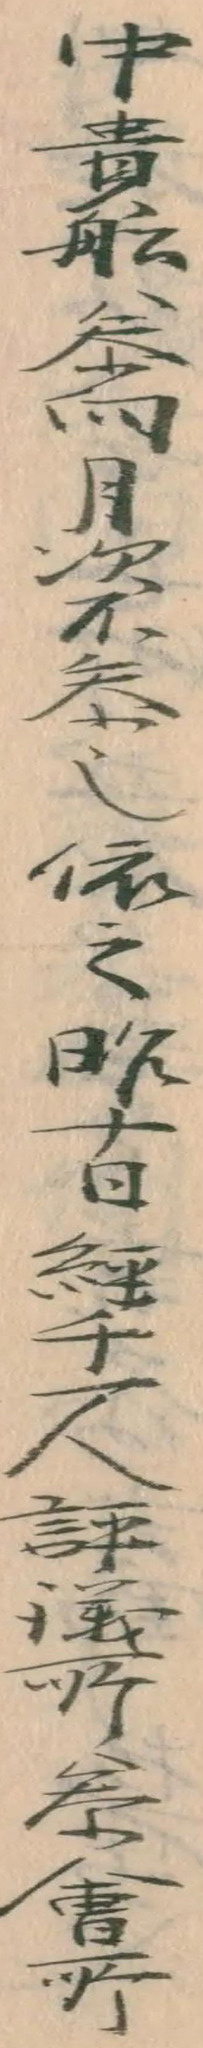中責舩ヘ参向月次不参也依之昨十日経千一人評議所参會所
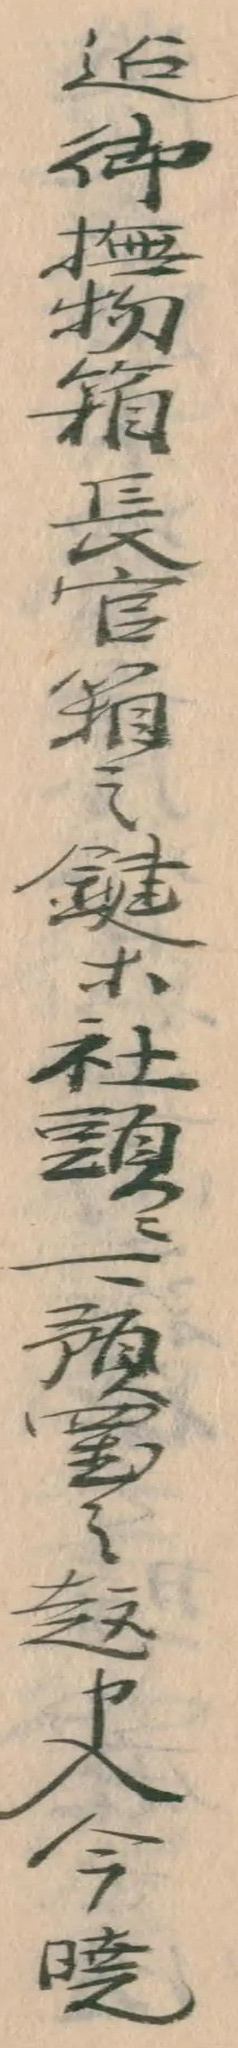迄御撫物箱長官箱之鍵等社頭ニ可預置之趣申入今暁
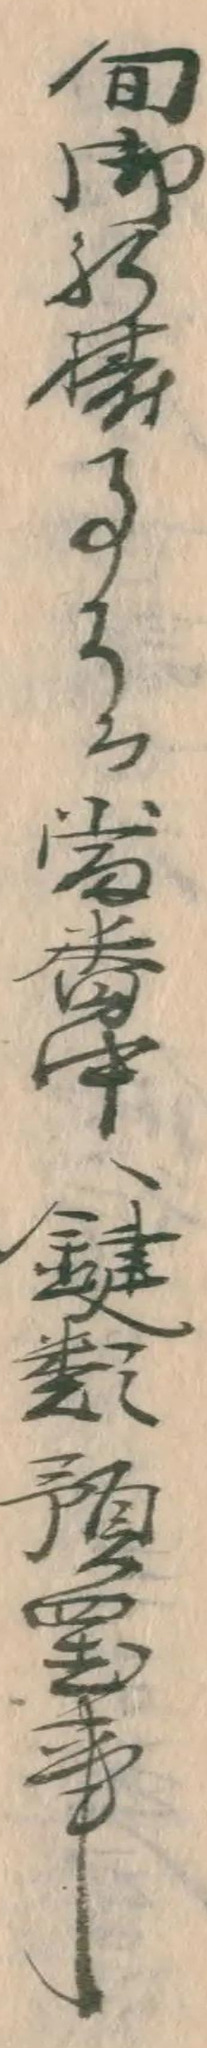旬御祈祷事了而當番中へ鍵類預置事
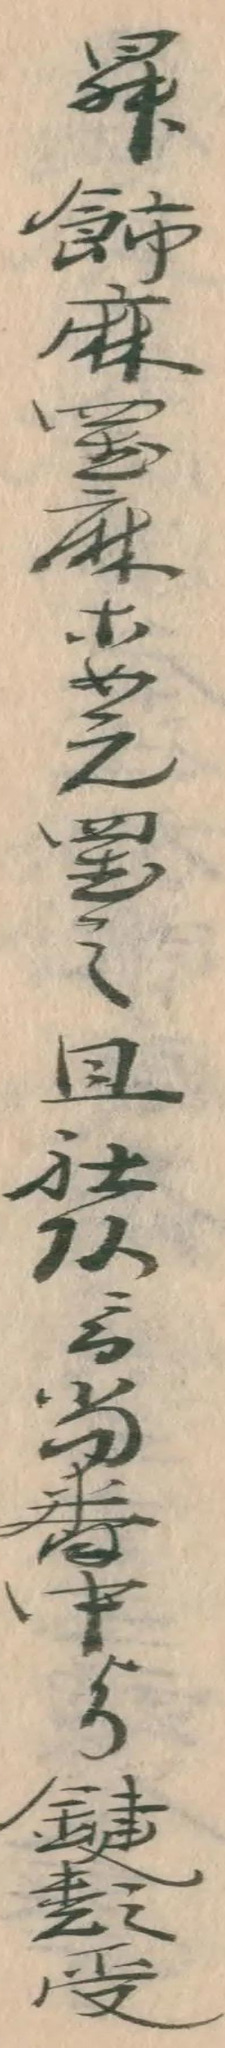昇飾麻置麻等如元置之且社頭ニ而當番中より鍵類受
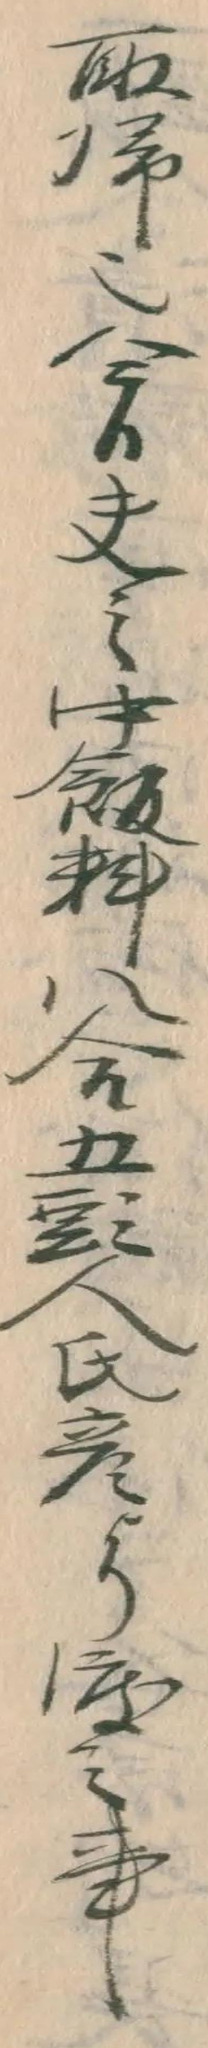取帰也今日夫之中飯料八合五頭人氏彦より渡之事
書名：賀茂社記録. 第73冊
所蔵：国立国会図書館 National Diet Library, JAPAN
